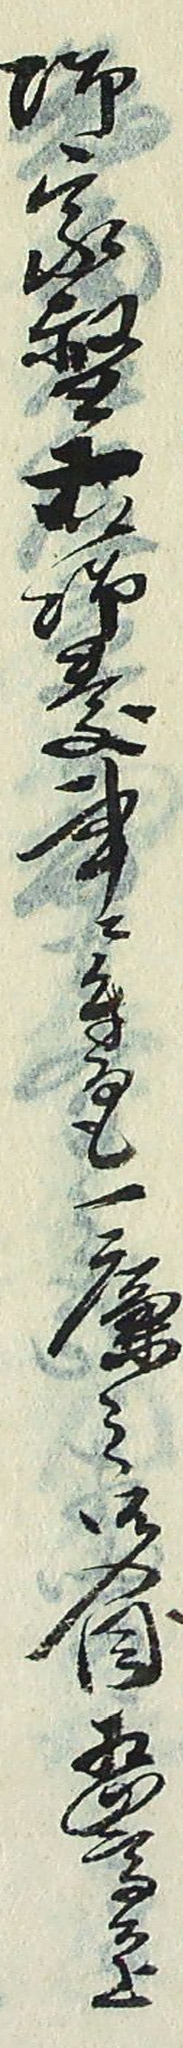御家督右御慶事ニ付而も一廉之御入目相止嵩候上
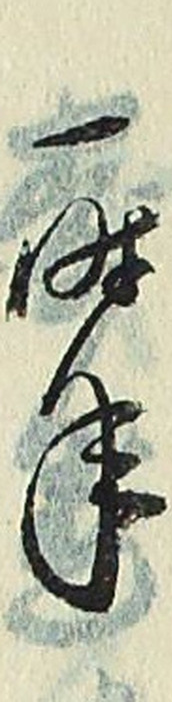一昨年
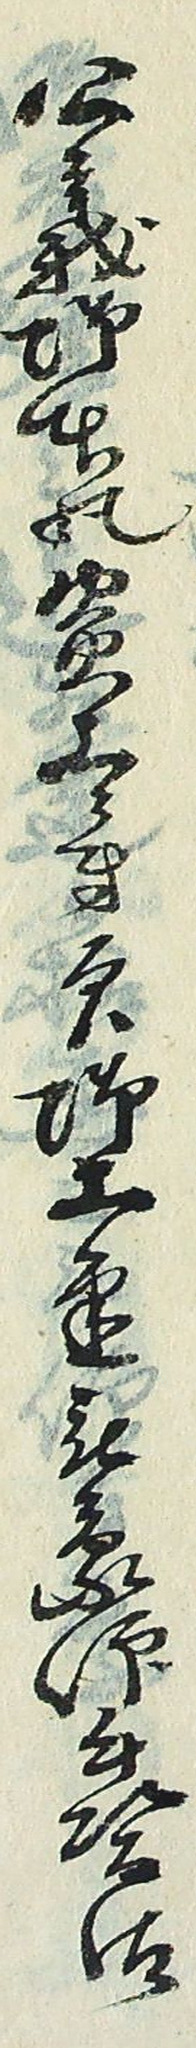公義御本丸炎上ニ付而ハ御上金被蒙仰犇と御
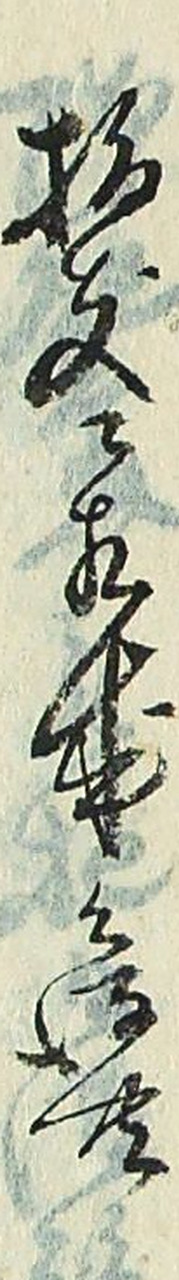指支ニ相成候得共
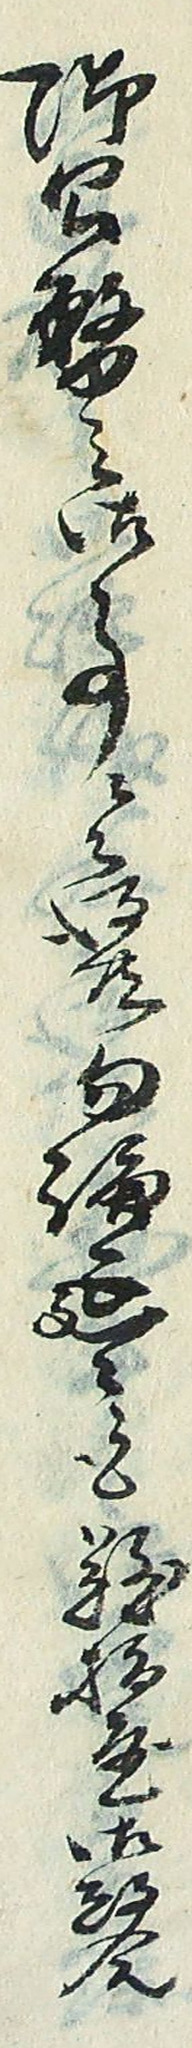御公務之御事ニ候得共勿論延々ニも難指置御都合

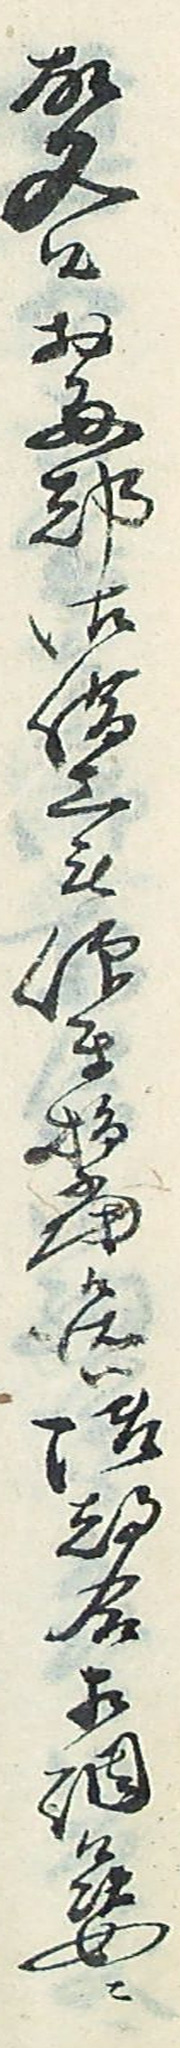故又候於両都御借上被仰付指當候所ハ御都合相調候姿ニ
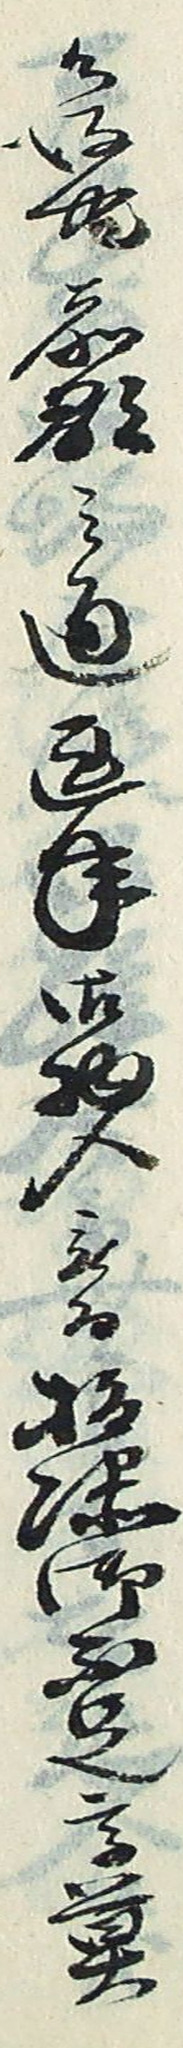候得共前顕之通逐年御物入被為指添御不足高莫
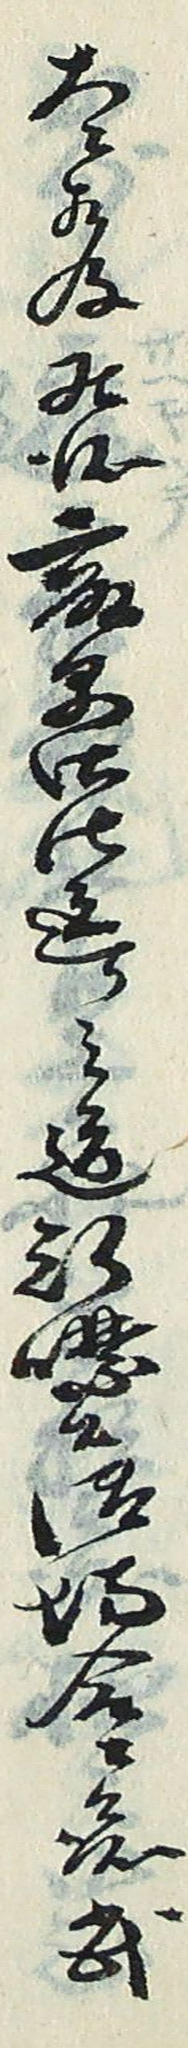大ニ相及居所最早御仕送り之道行噤候御場合ニ候所當
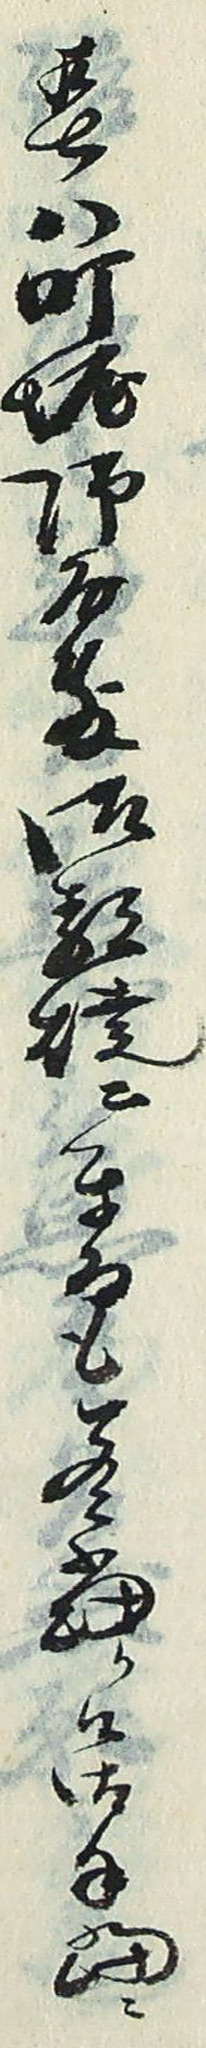春八町堀御家敷御類焼ニ付而も差當り候御手當ニ
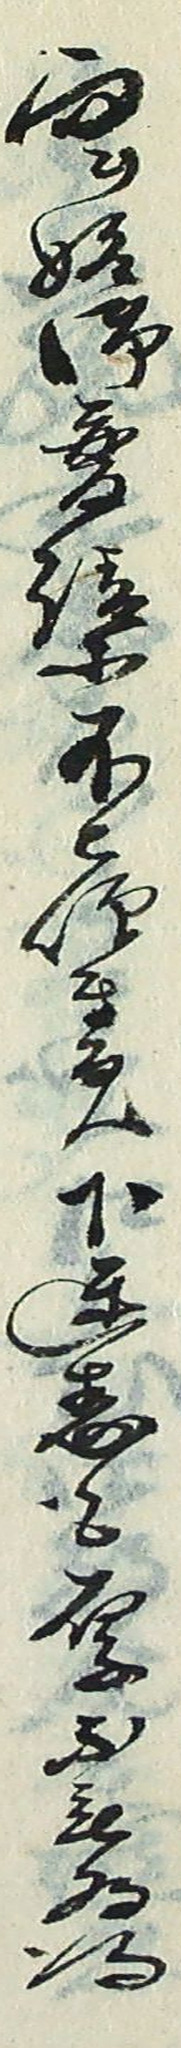向ヲ始御普請等不被仰付而ハ御迷惑も厚不被為得
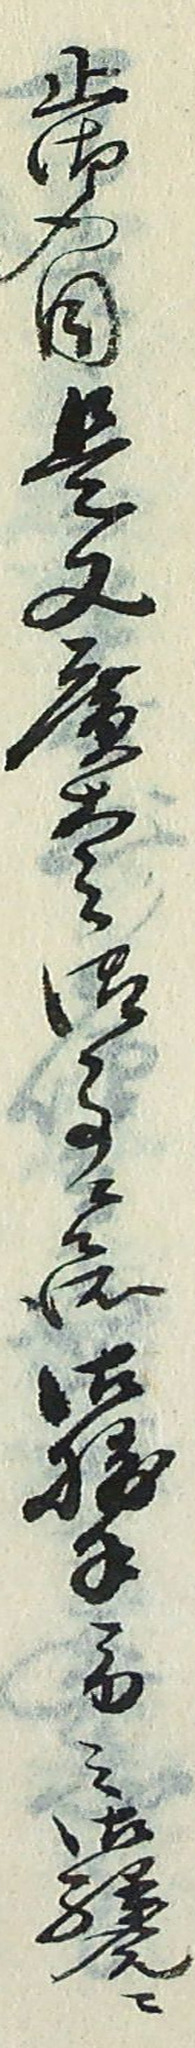止御入目是又廣大之御事ニ候所御勝手方之御繰合ニ
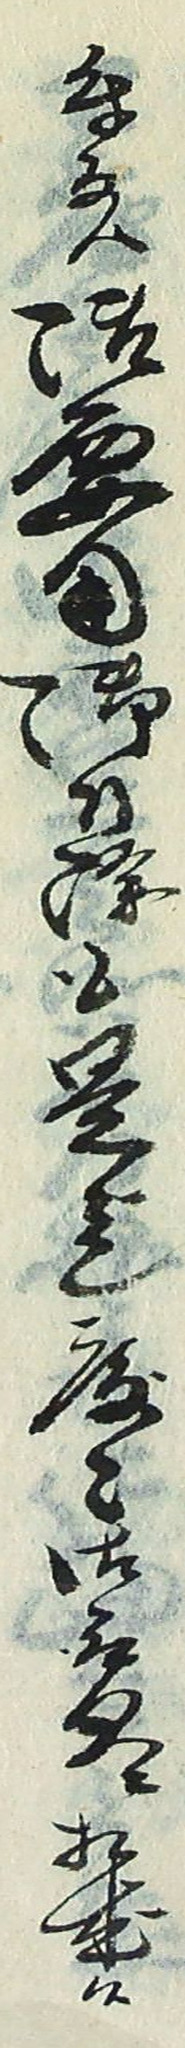付而ハ御要用御引除も是迄度々御取欠ニ相成候
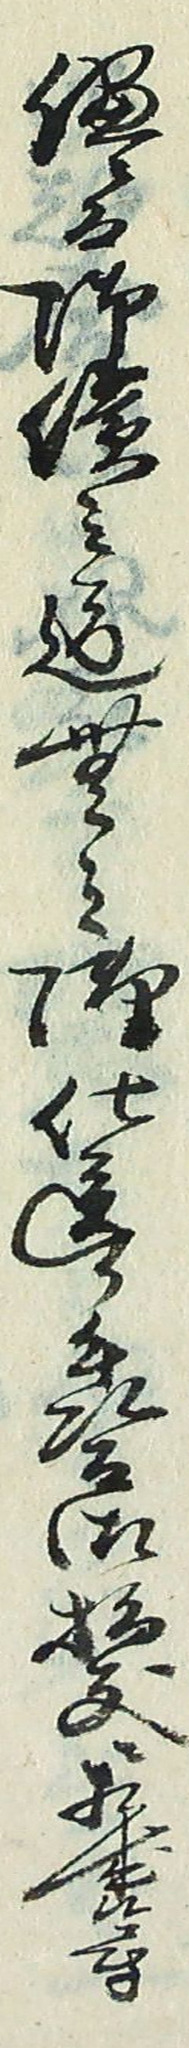儘ニ而御倹之道無之御仕送り犇と御指支ニ相成候ニ付
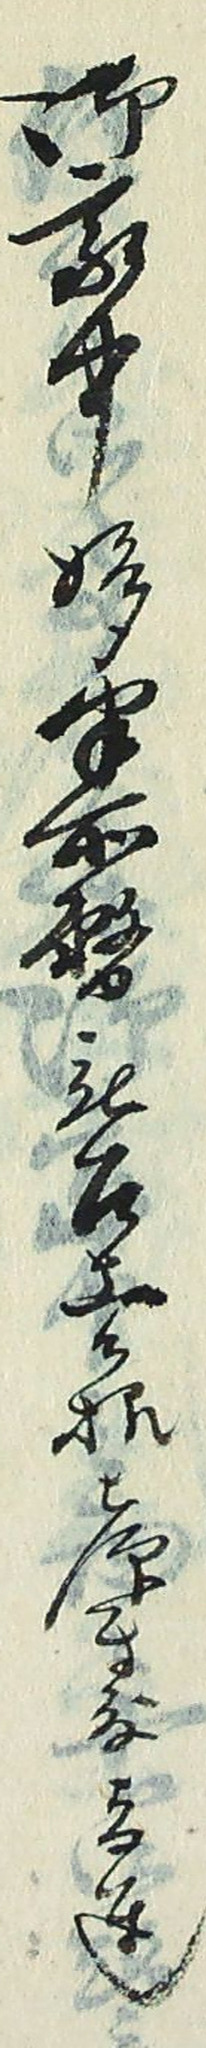御家中始メ半所務被召上候様被仰付度旨達
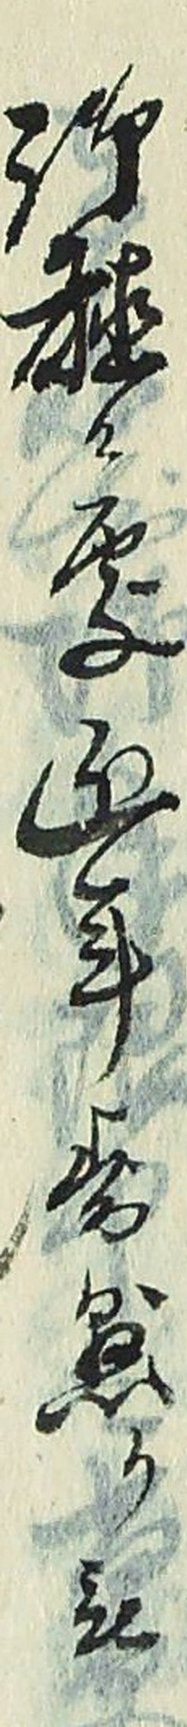御聴候處近年歩懸り被
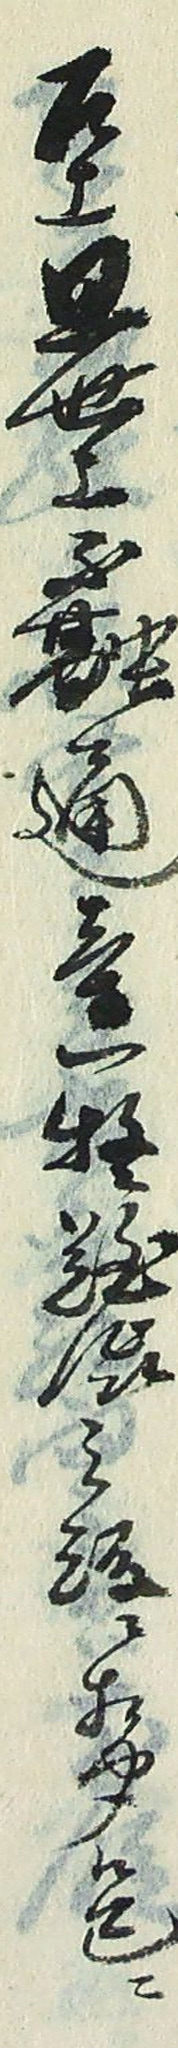召上且世上不融通旁一牧ニ難渋之趣ニ相聞候已ニ
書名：諸御趣意書并御下知向之写
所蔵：鳴門教育大学 Naruto University of Education
